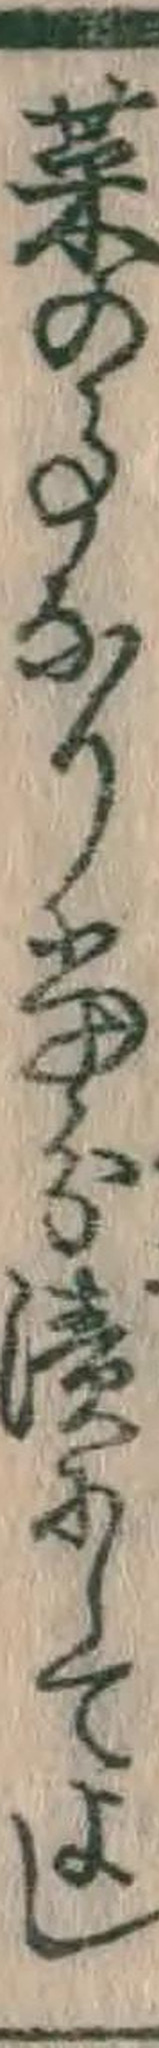菜の事なり当分漬にしてよし
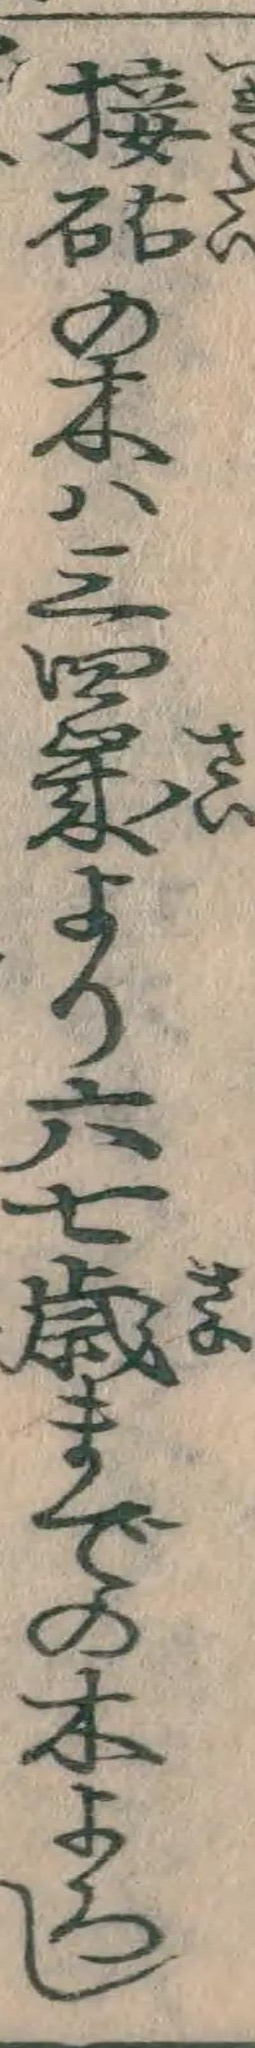接砧の木は三四歳より六七歳までの木よろし
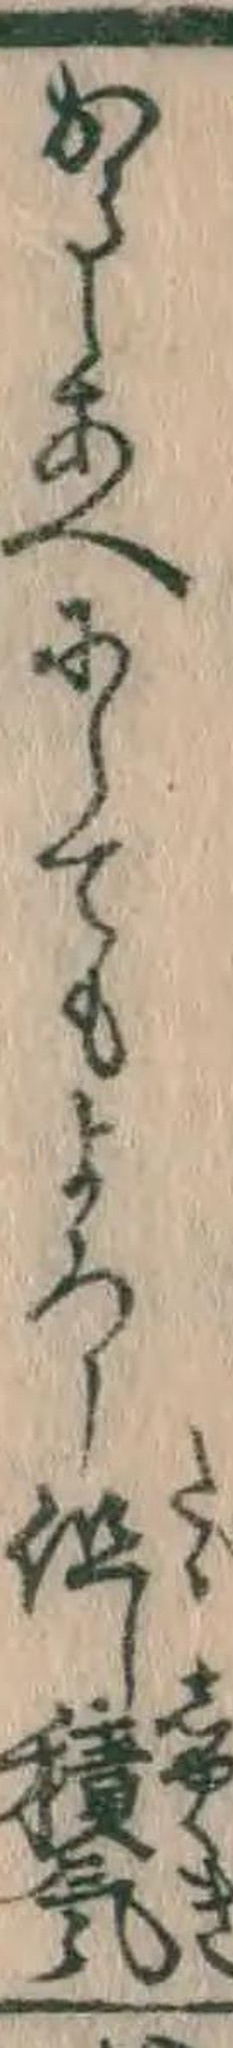からしあへにしてもよろし但し積気
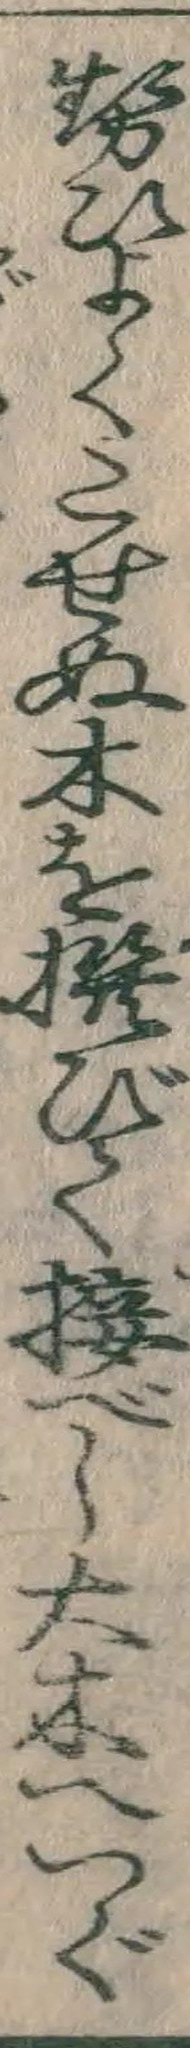勢ひよくこせぬ木を撰びて接べし大木へつぐ
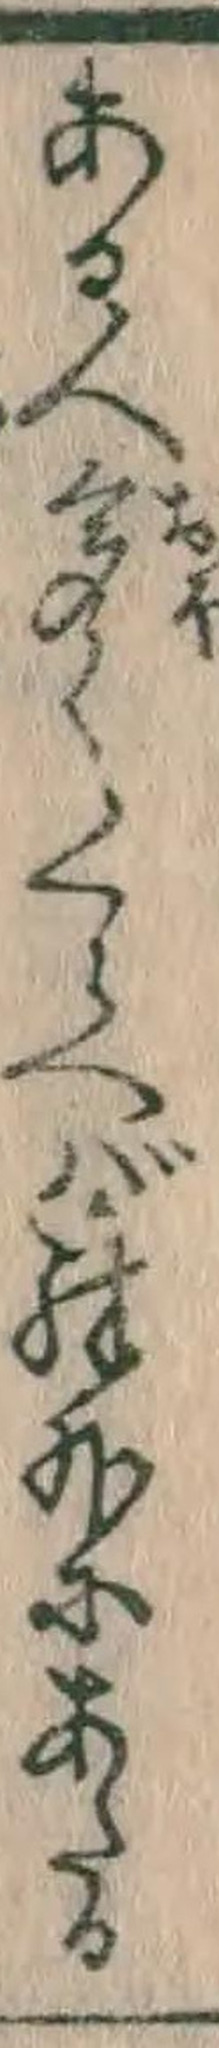ある人多くくらへば殊外にあたる
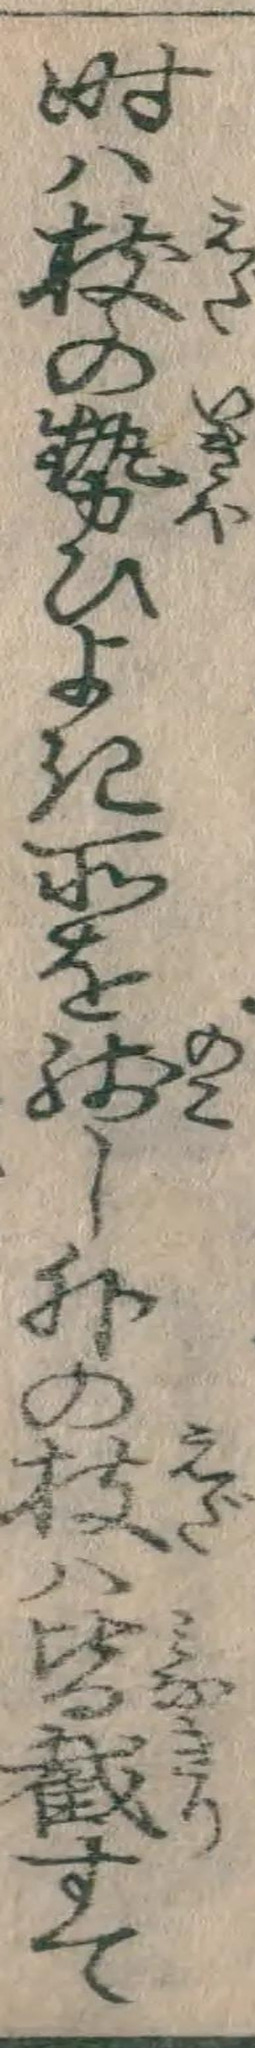時は枝の勢ひよき所を残し外の枝は皆截すて
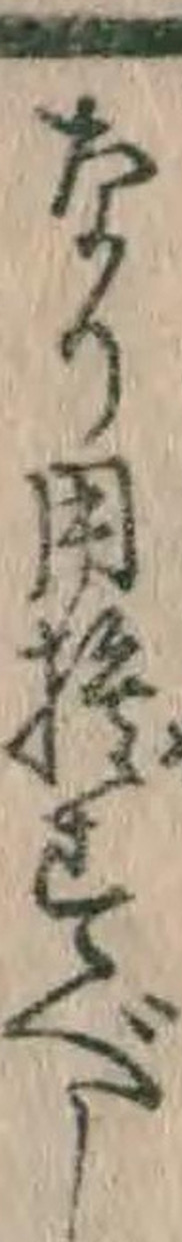なり用捨すべし
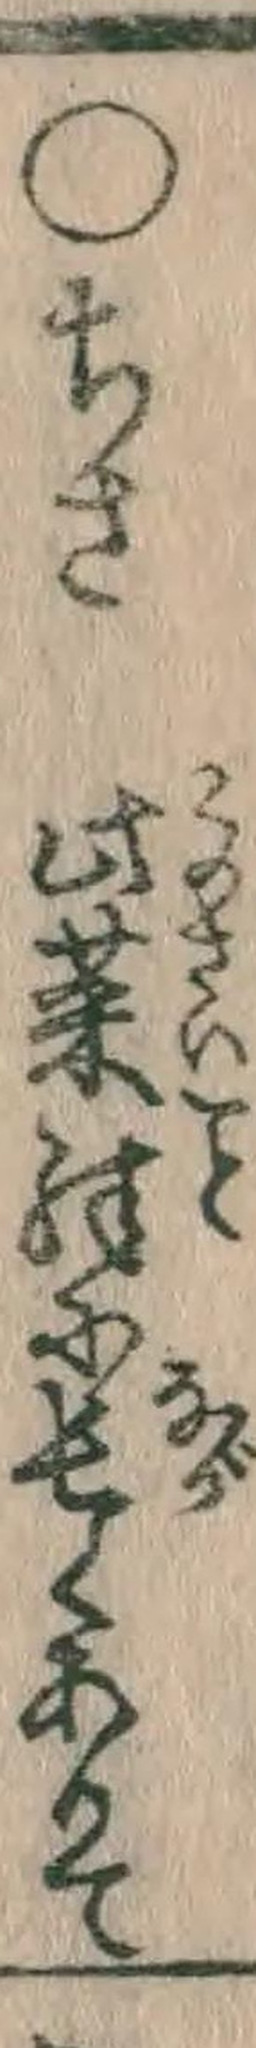○ちさ此菜殊に長くありて
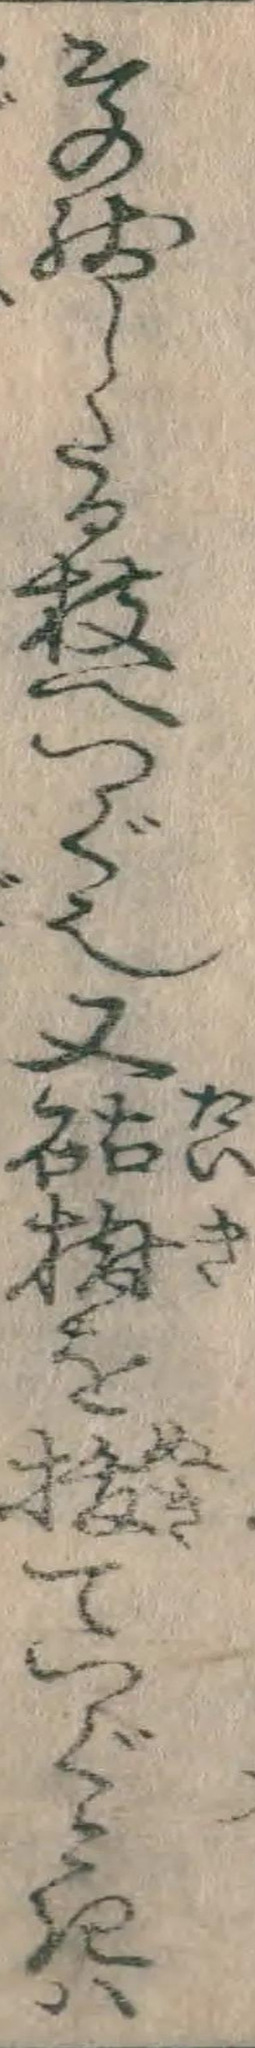その残したる枝へつぐ也又砧樹を抜てつぐときは
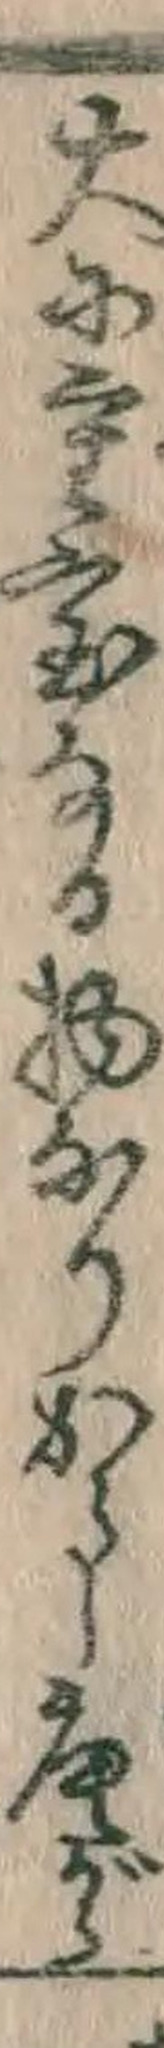大に重宝なる物なりからし唐がら
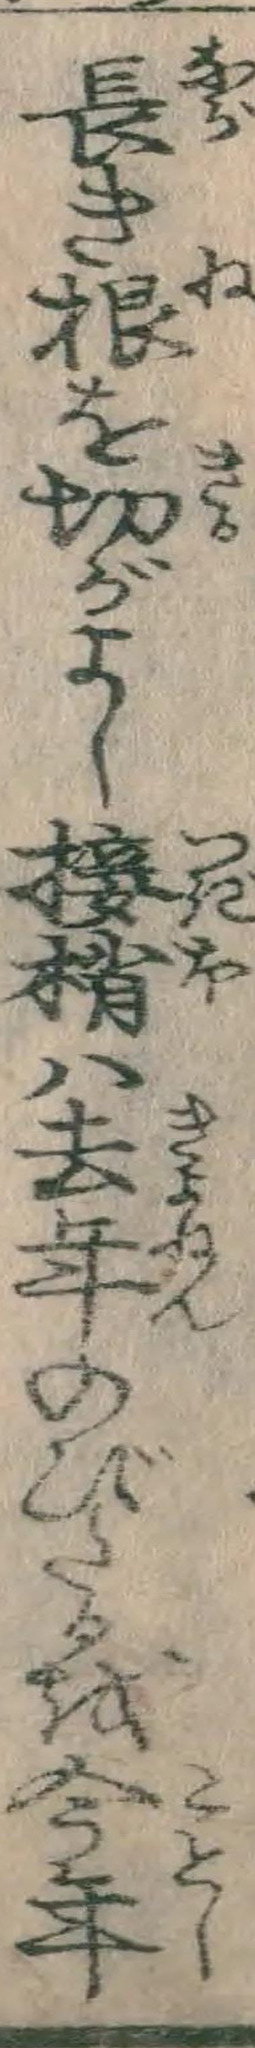長き根を切がよし接梢は去年のびたるを今年
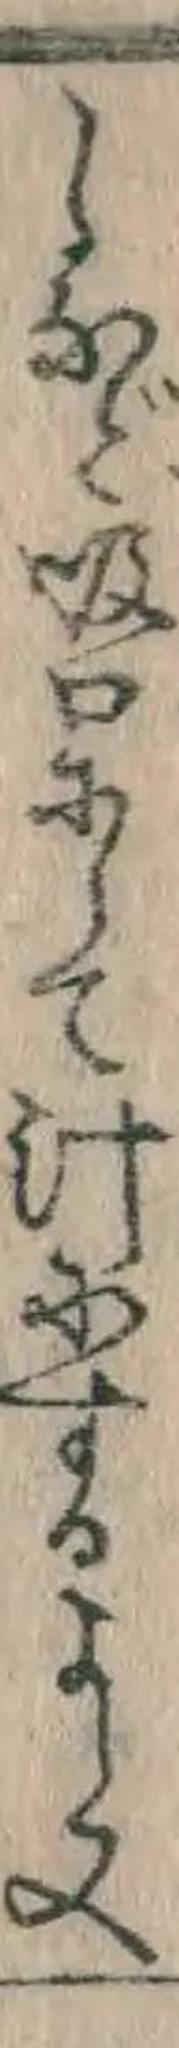しなど吸口にして汁にするよし又
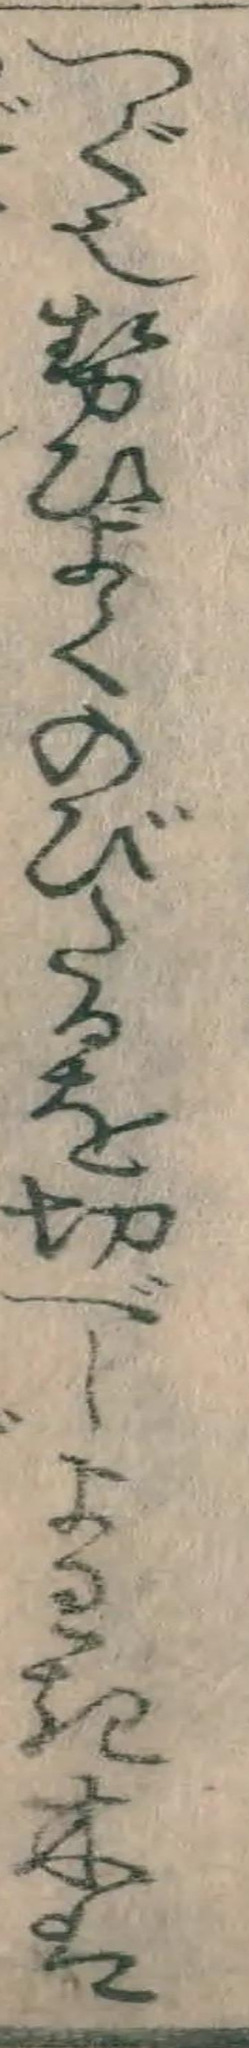つぐ也勢ひよくのびたるを切べしよわき木は
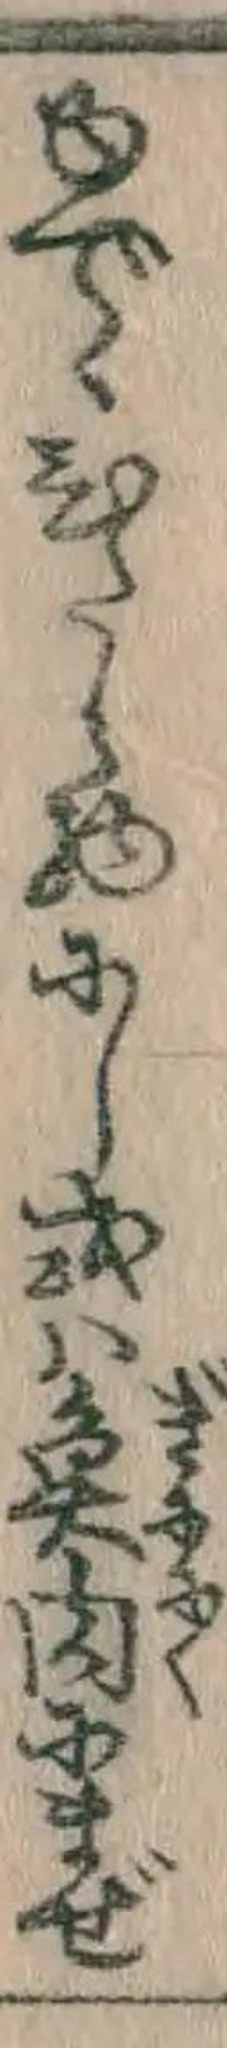ゆでゝひたし物にし或は魚肉にまぜ
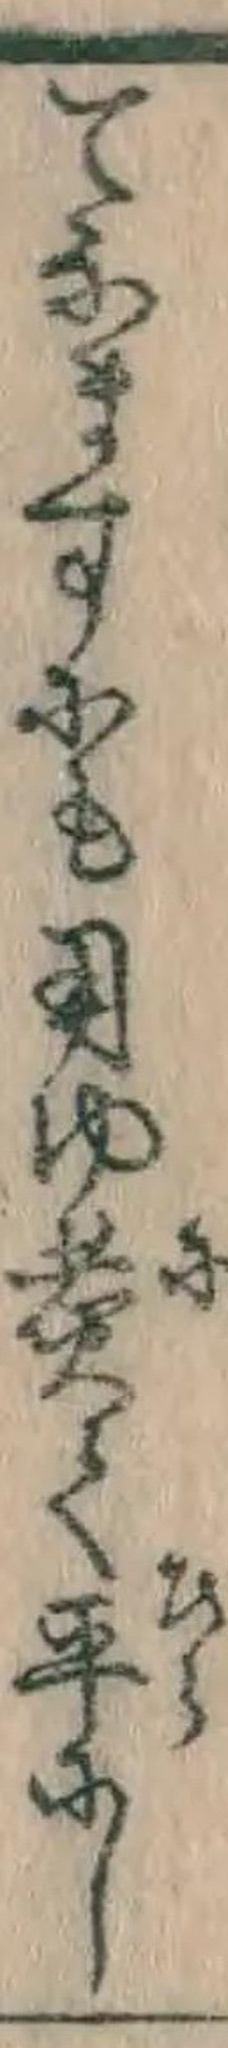てなますにも用ゆ煮て平にし
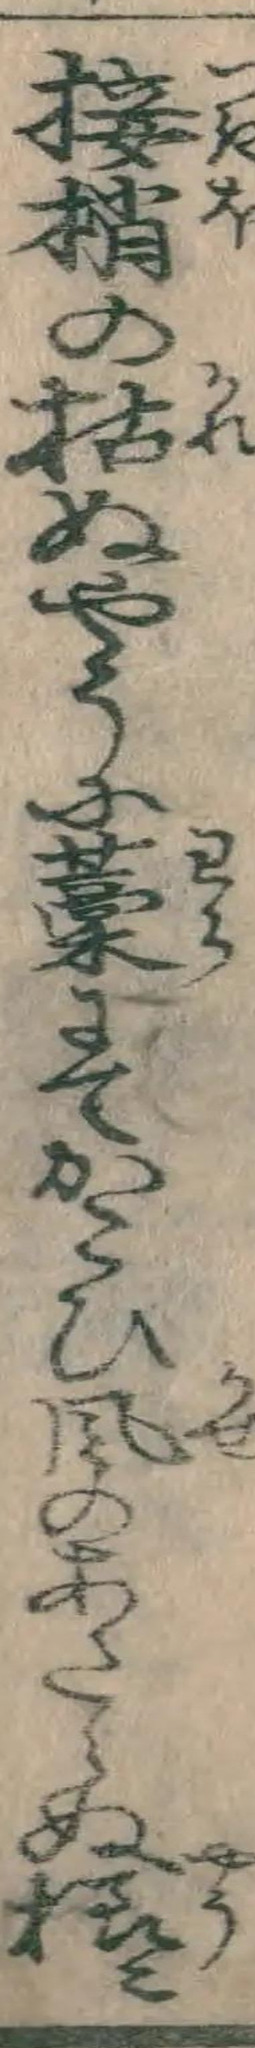接梢の枯ぬやうに藁にてかこひ風のあたらぬ様に
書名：広益秘事大全 3巻. [5]
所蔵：国立国会図書館 National Diet Library, JAPAN
